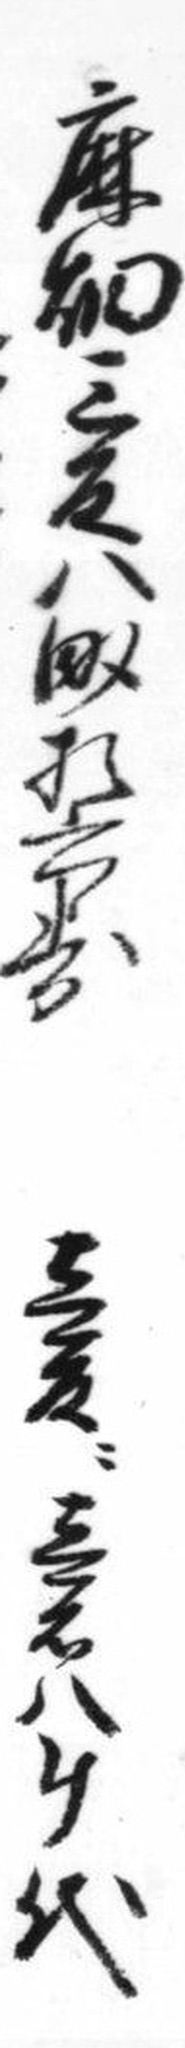麻畑三反八畝拾六歩壱反二壱石八斗代
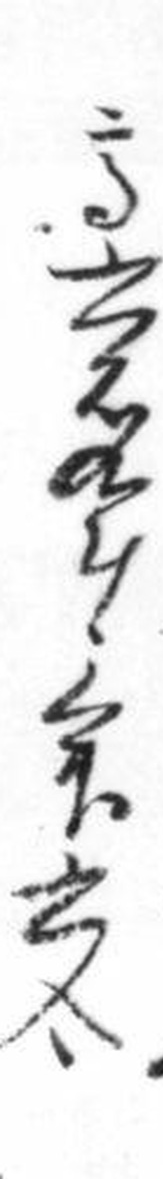高六石九斗三升六合
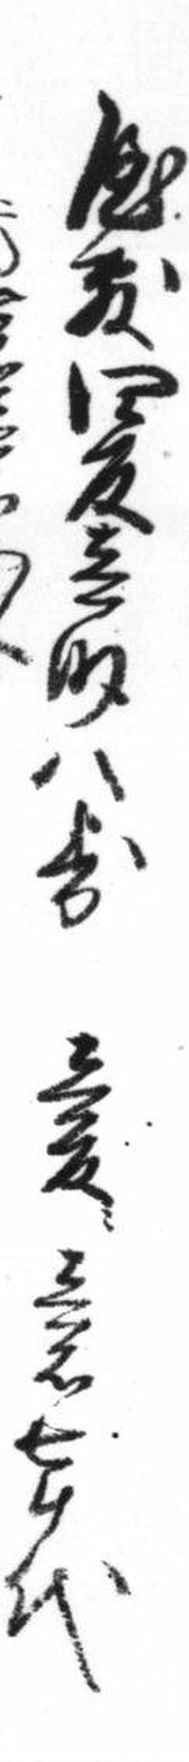屋敷四反壱畝八歩壱反二壱石七斗代
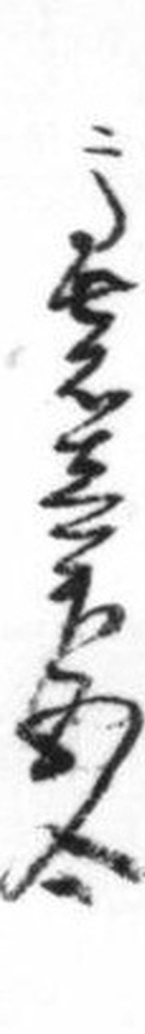高七石壱升五合
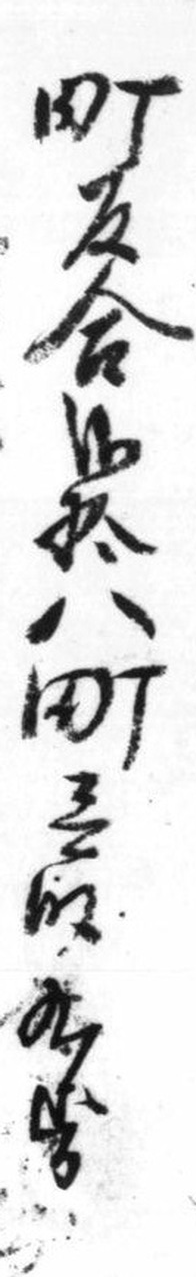町反合弐拾八町壱畝九歩
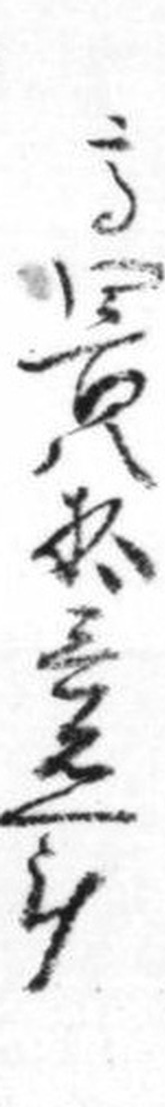高四百八拾三石一斗
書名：越前国大野郡今井村御検地帳
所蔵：福井県文書館 Fukui Prefectural Archives
